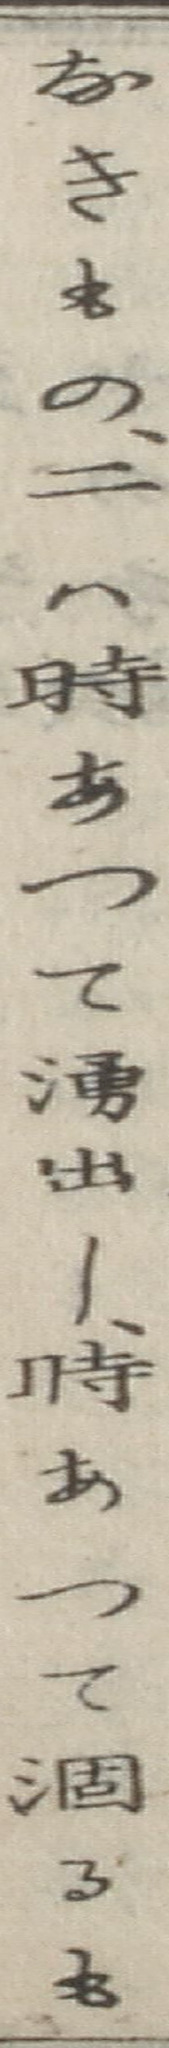なきもの、二は時あつて湧出し、時あつて涸るも
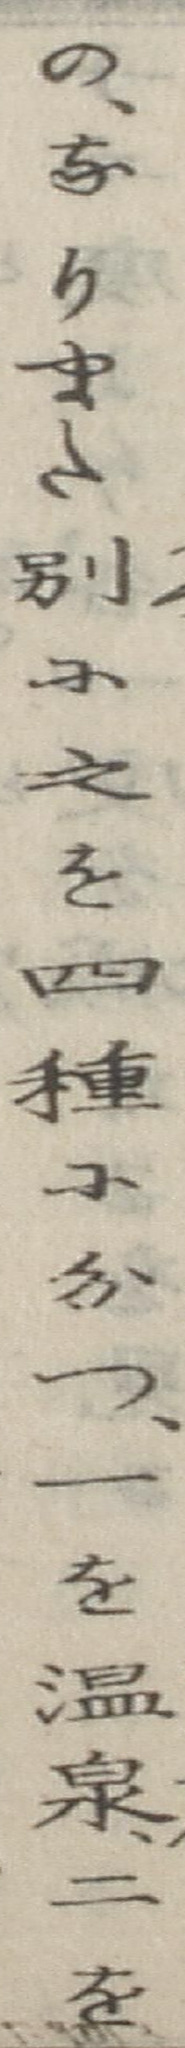の、なりまた別に之を四種に分つ、一を温泉、二を
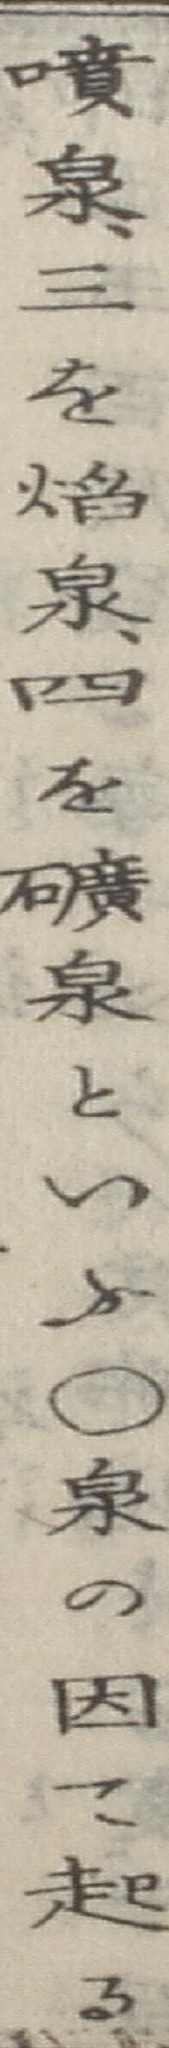噴泉、三を焔泉、四を礦泉といふ〇泉の因て起る
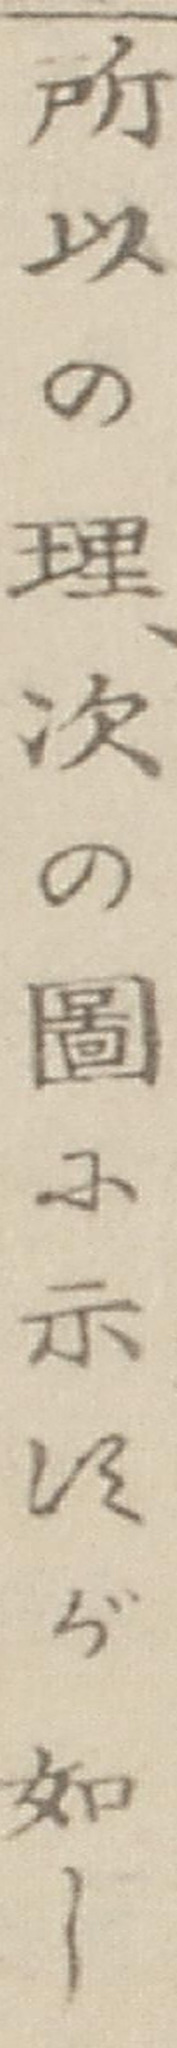所以の理、次の圖に示すが如し
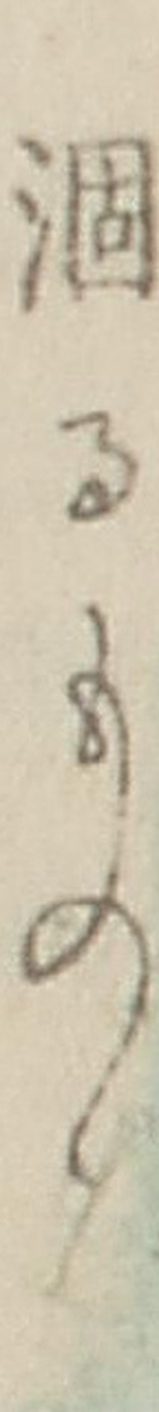涸るものゝ
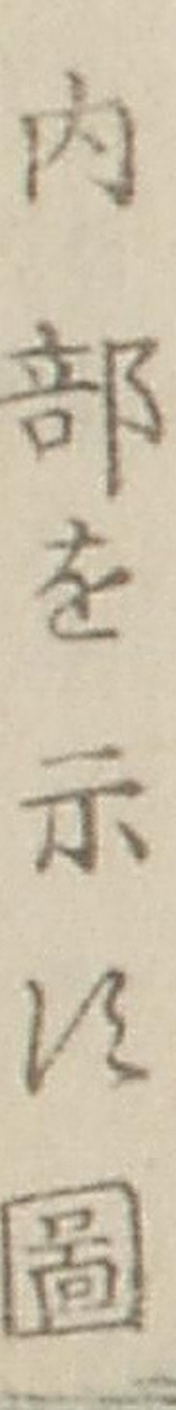内部を示す圖

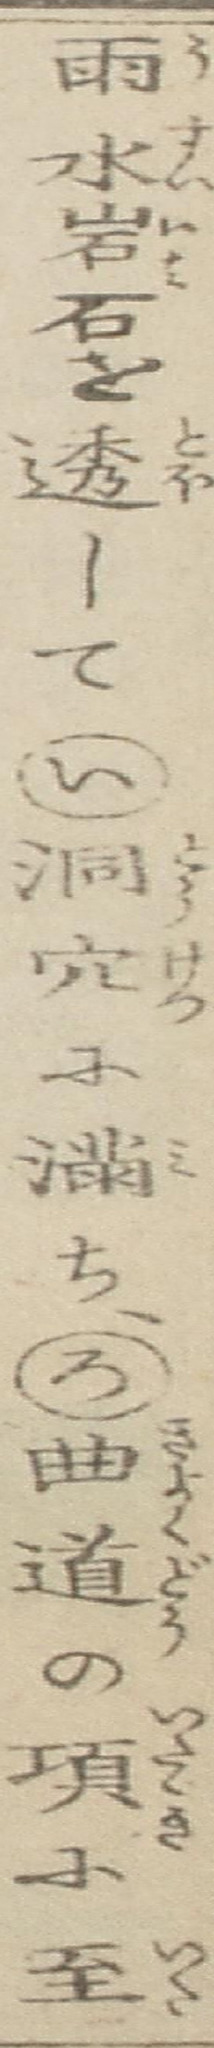雨水岩石を透してい洞穴に満ち、ろ曲道の頂に至
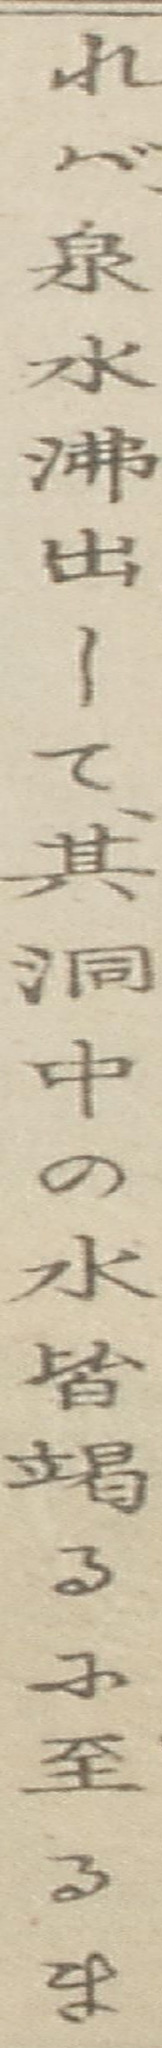れば、泉水沸出して、其洞中の水皆竭るに至るま
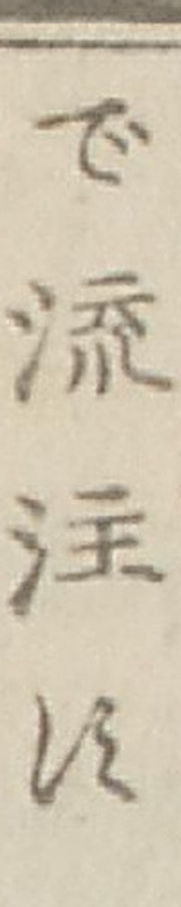で流注す
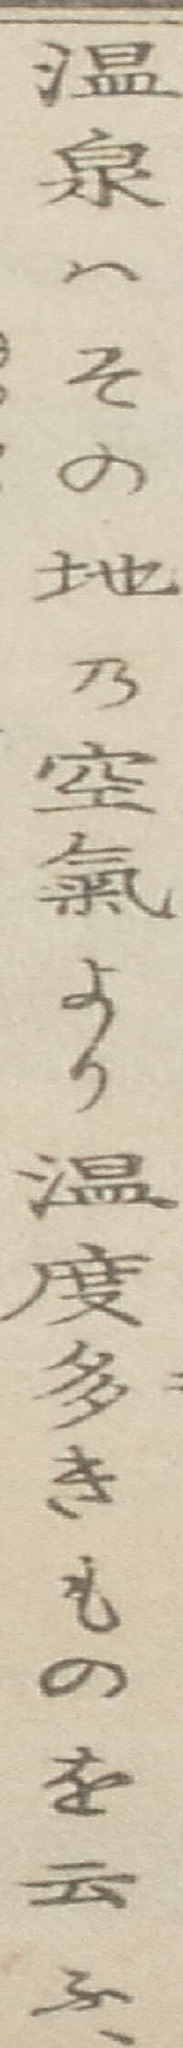温泉はその地の空気より温度多きものを云ふ、
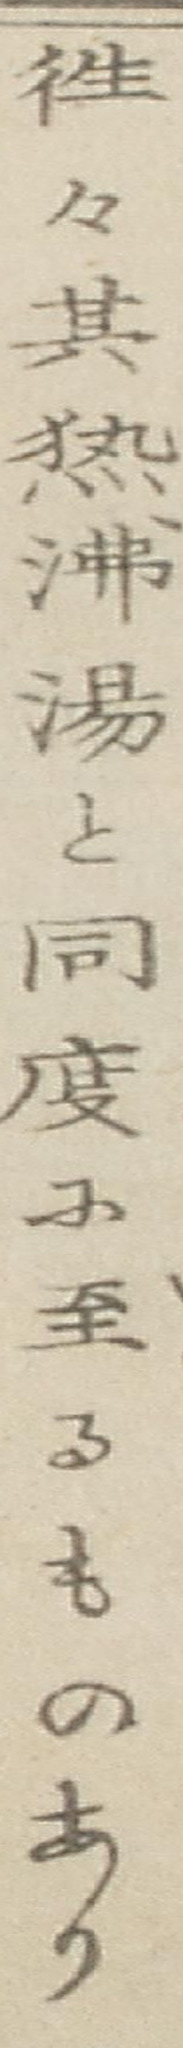往々其熱、沸湯と同度に至るものあり
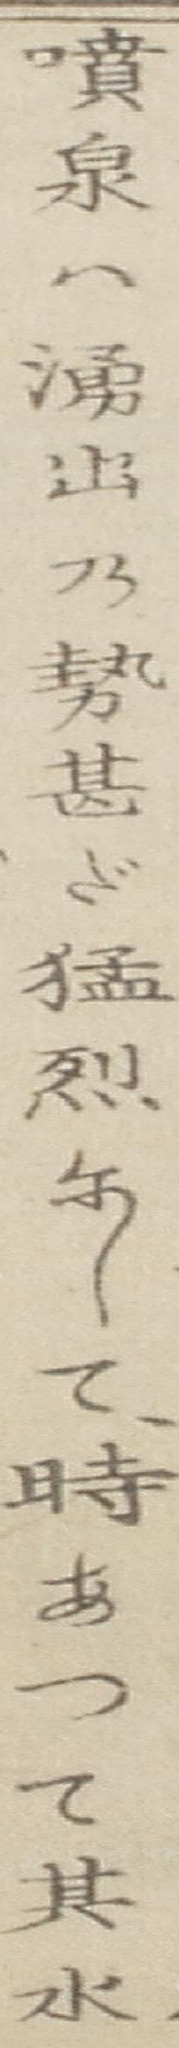噴泉は湧出の勢甚だ猛烈にして、時あつて其水
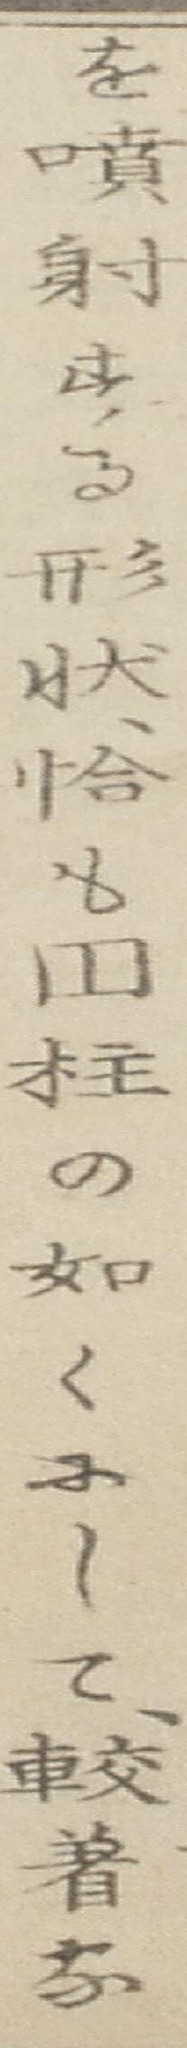を噴射する形状、恰も円柱の如くにして、較著な
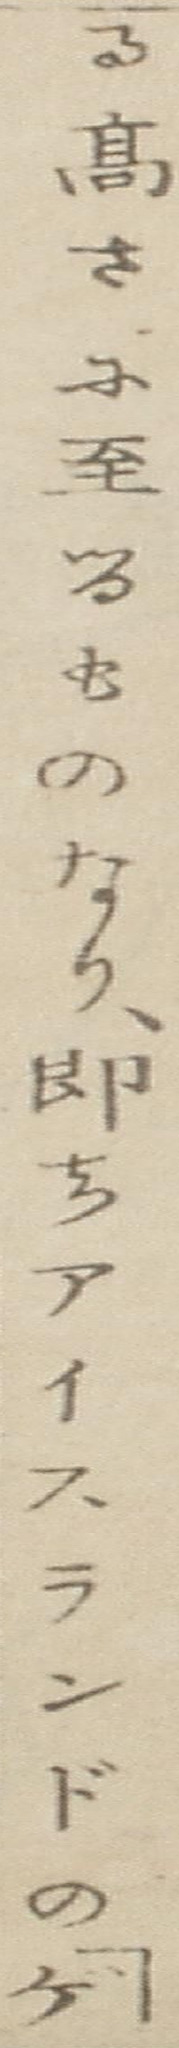る高さに至るものなり、即ちアイスランドの「ゲ
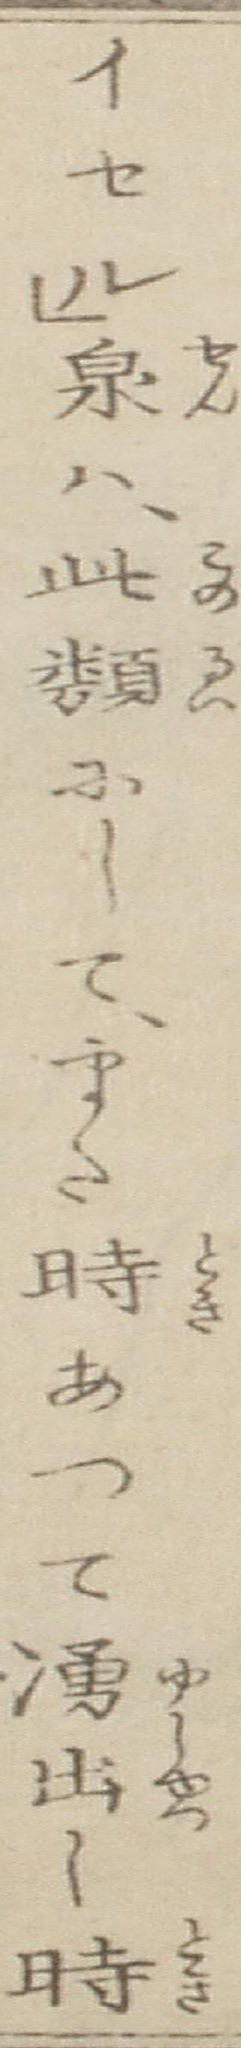イセル」泉は、此類にして、また時あつて湧出し時
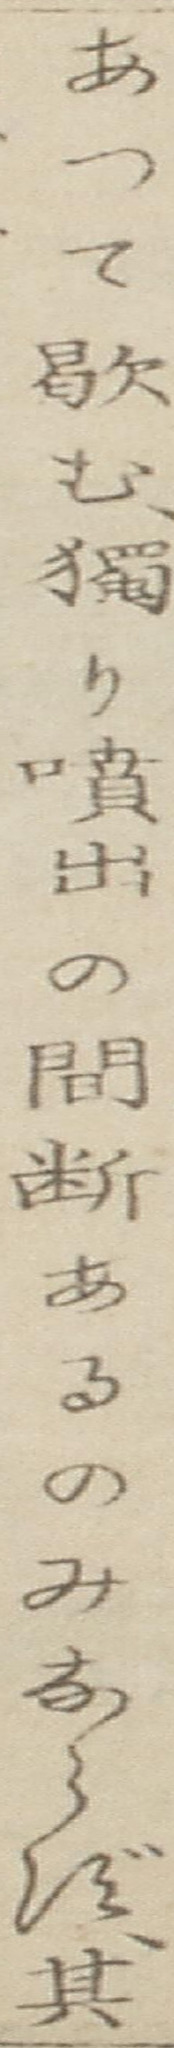あつて歇む、独り噴出の間断あるのみならず、其
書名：訓蒙　天然地理學　中
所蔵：東京大学地震研究所図書室 Earthquake Research Institute Library, The University of Tokyo, JAPAN
